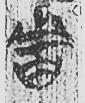周
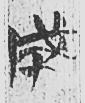成
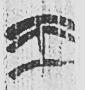王
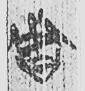周
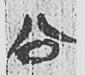公
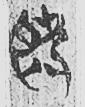既
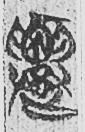{䙴止}
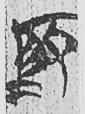殷
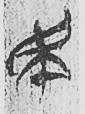民
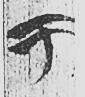于
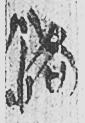洛
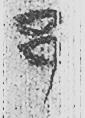邑
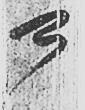乃
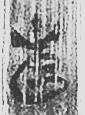{山𡴎}
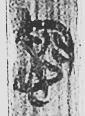念
